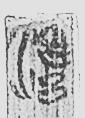澭
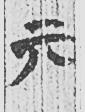亓
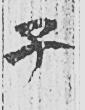子
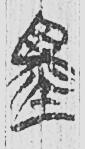墨
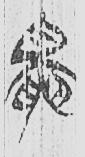要
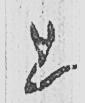也
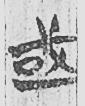或
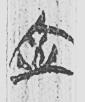室
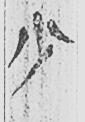少
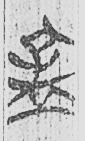{孔皿}
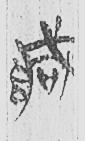戕
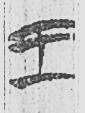王
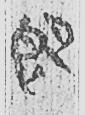即
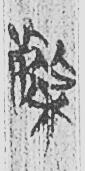殜
